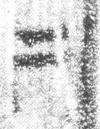二
